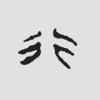行
